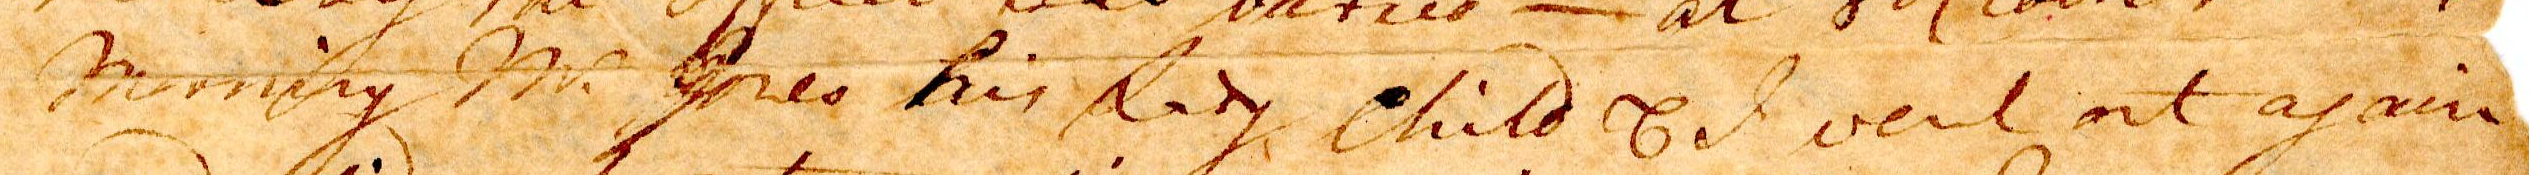morning M^r. Jones his lady child & I went out again
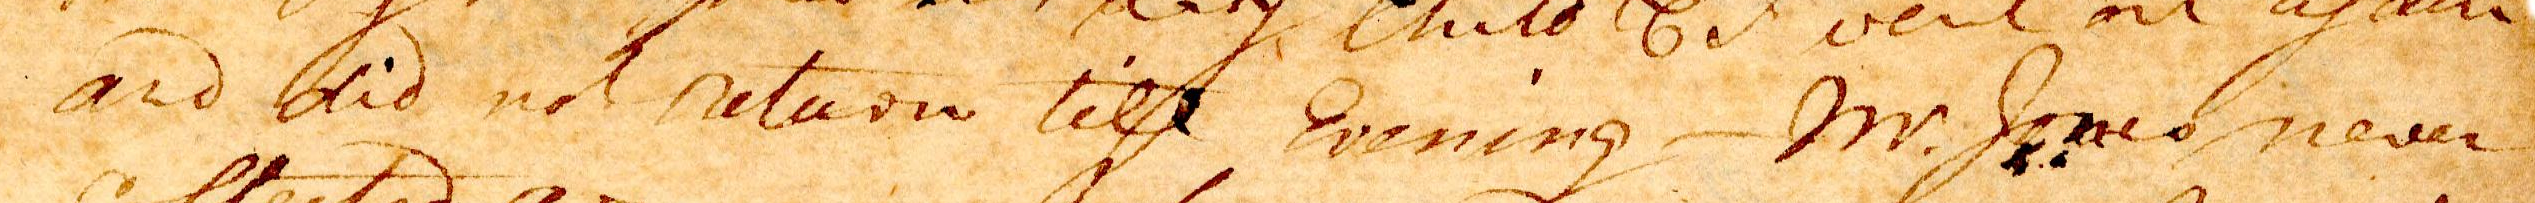and did not return till Evening- M^r. Jones never
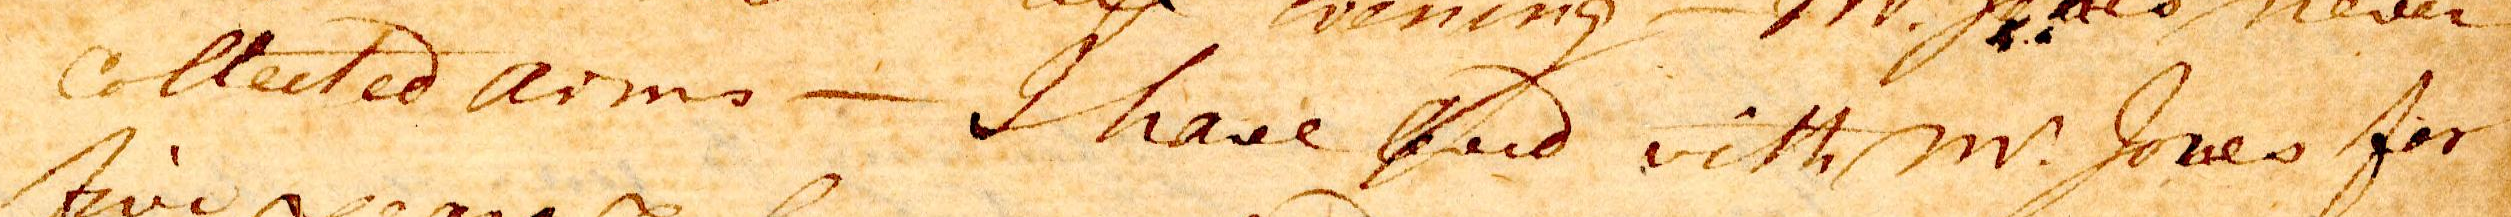collected arms- I have lived with M^r. Jones for
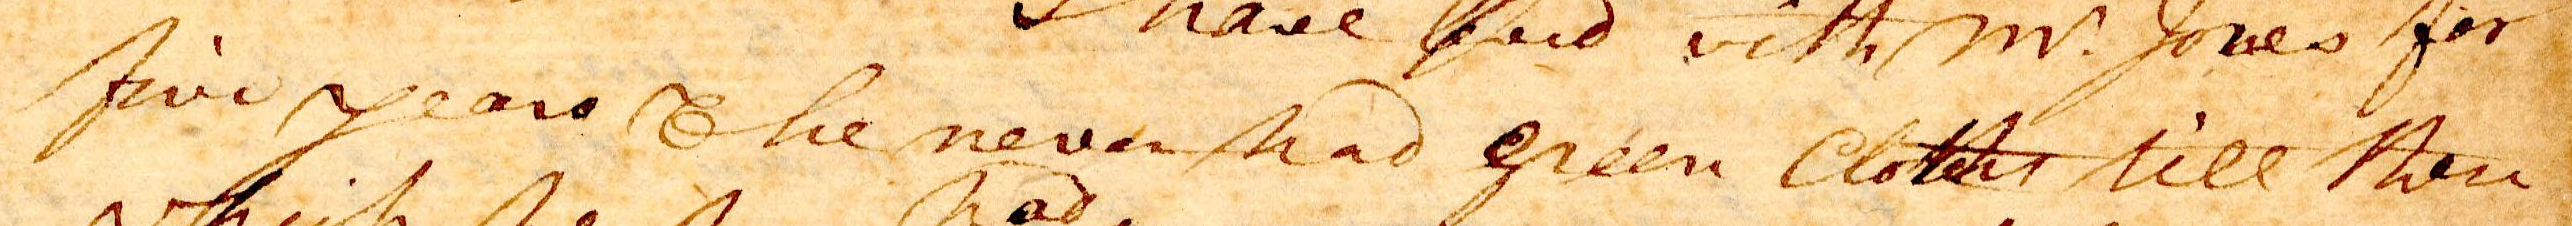five years & he never had green clothes till these
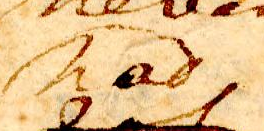had
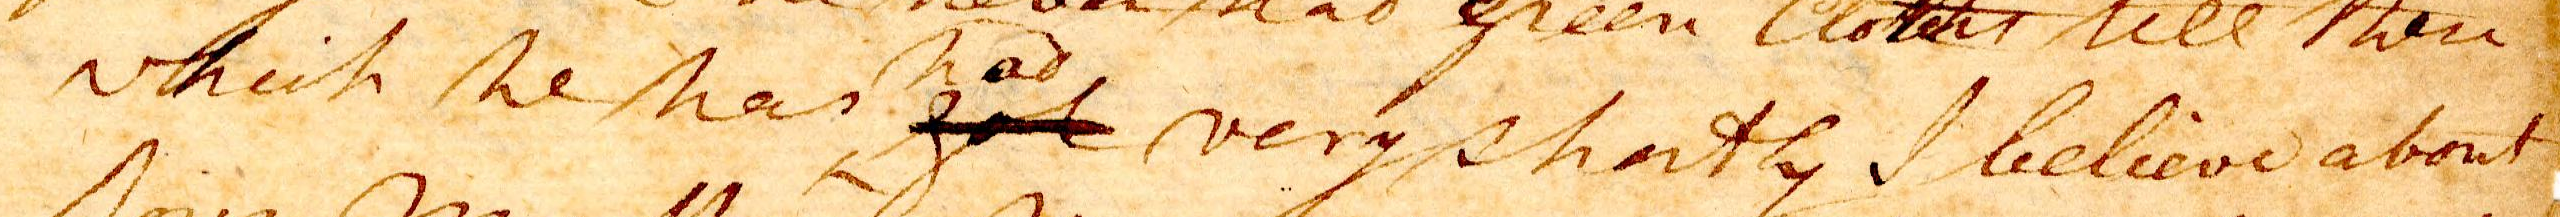which he has [got] very shortly I believe about
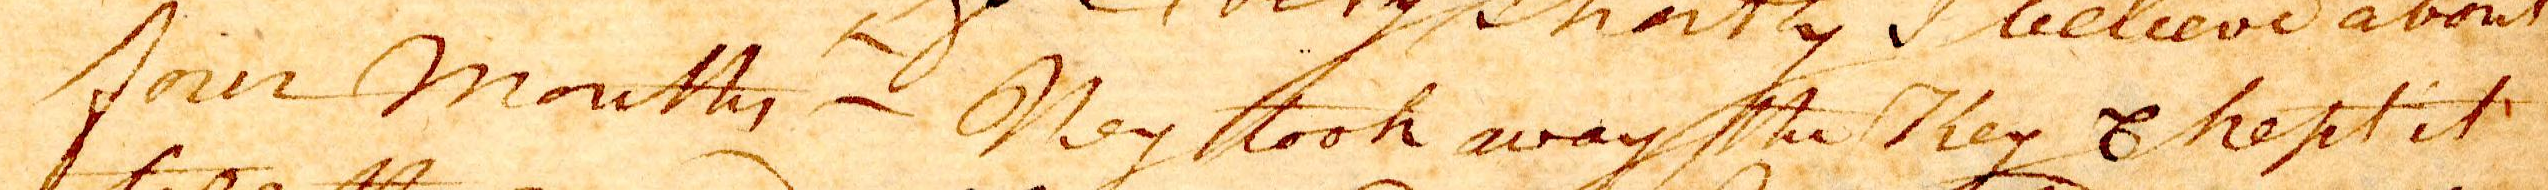four months- They took away the key & kept it
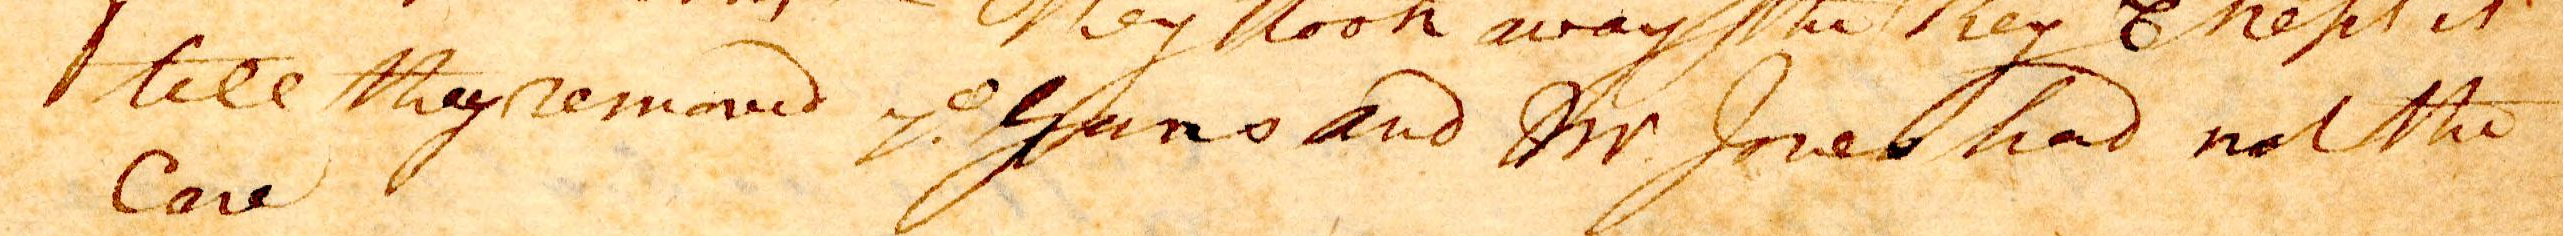till they removed y^e guns and M^r Jones had not the
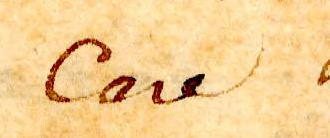Care
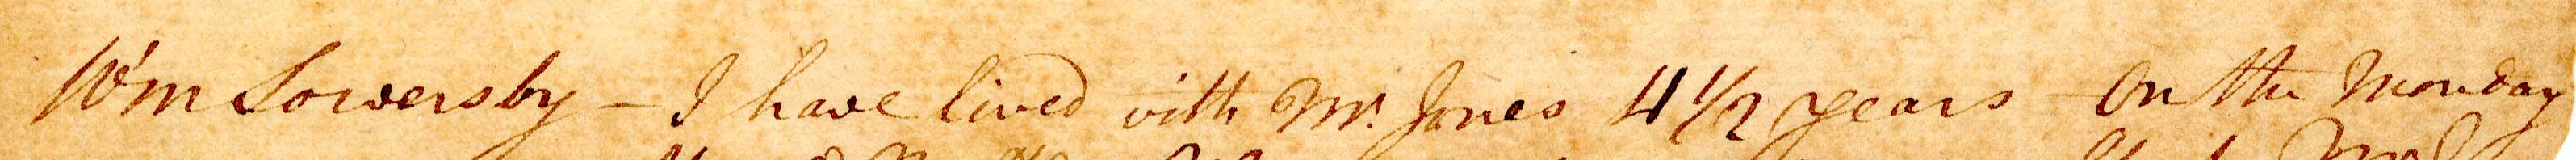W'm Sorsersby – I have lived with M^r. Jones 4 1/2 years -On the Monday
